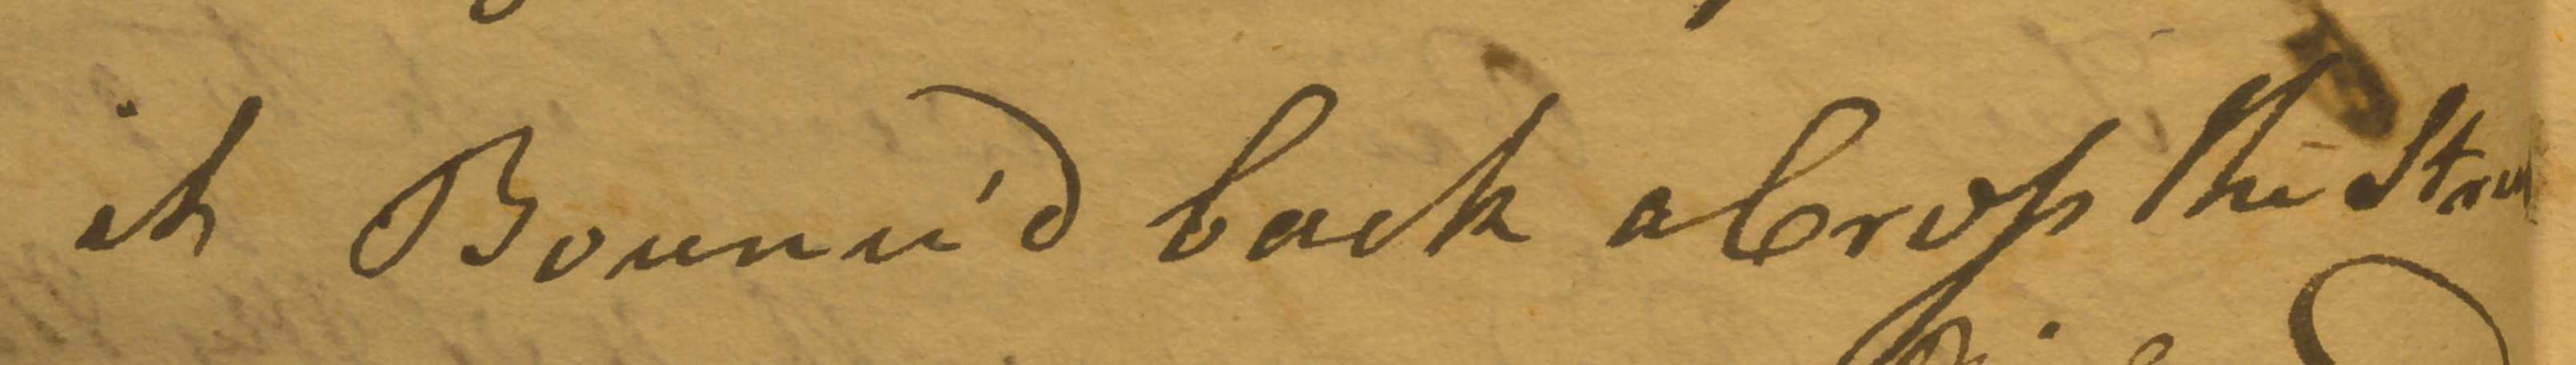it Bounce'd back a Cross the Straw
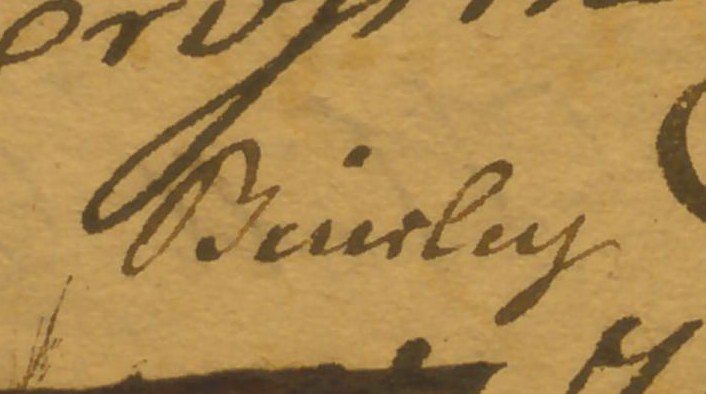Buirley
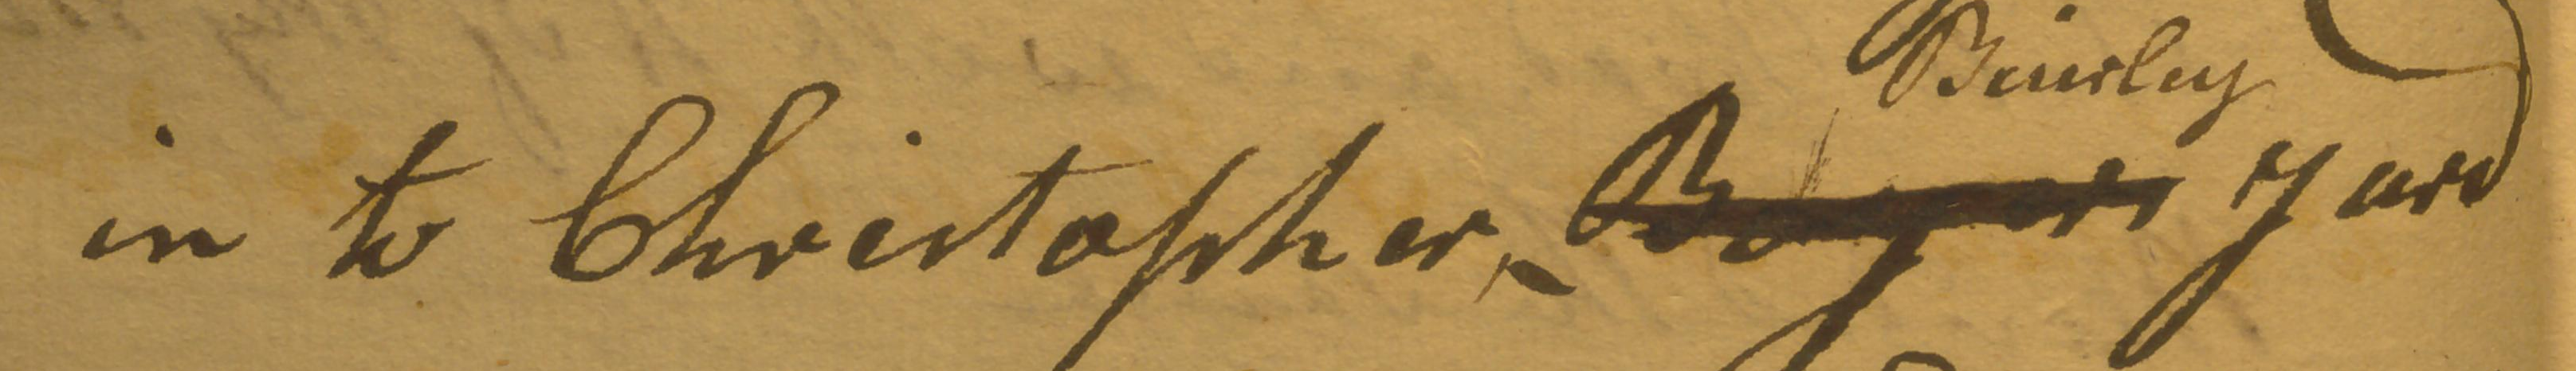in to Christopher ^ [_______] yard
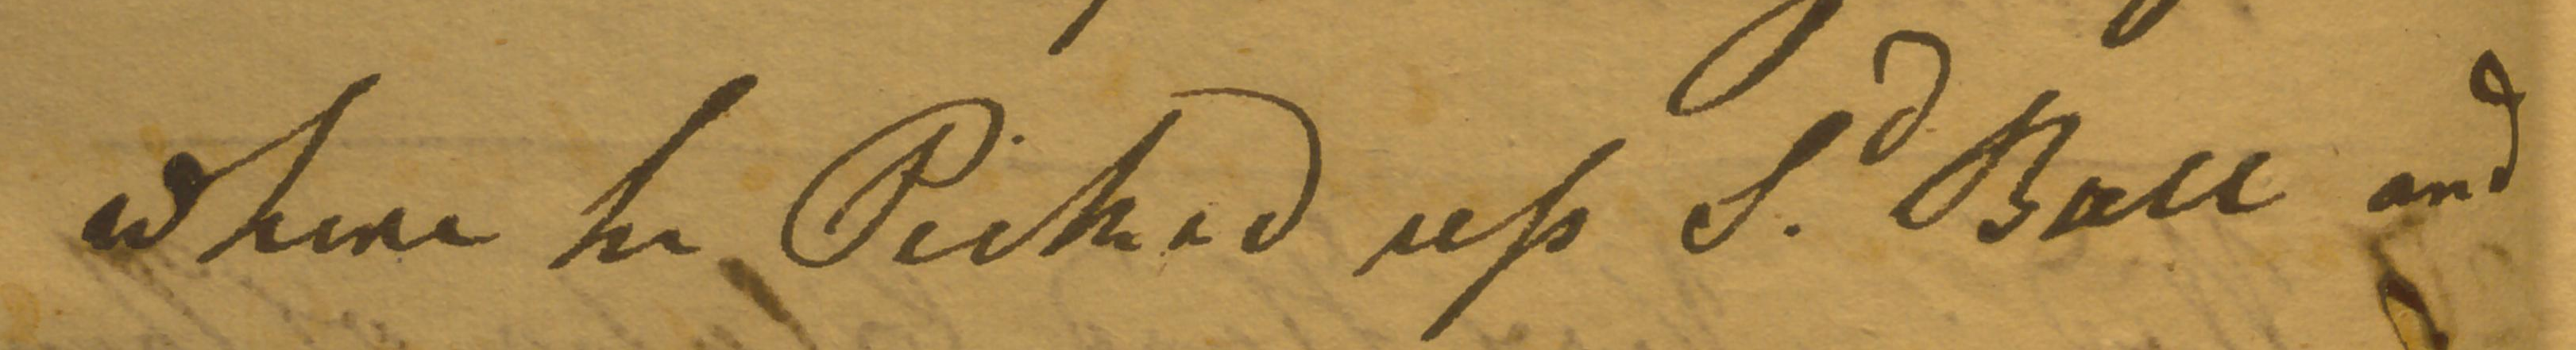where he Picked up s^d. Ball and
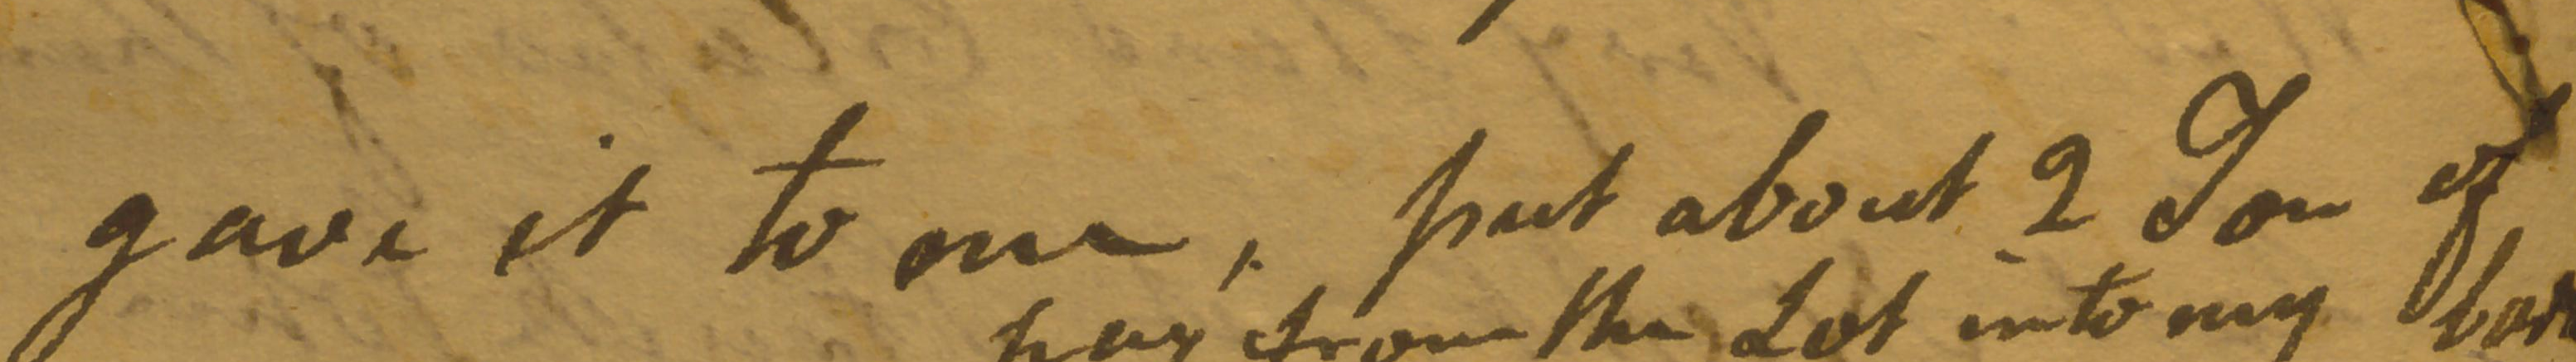gave it to me, put about 2 Ton of
